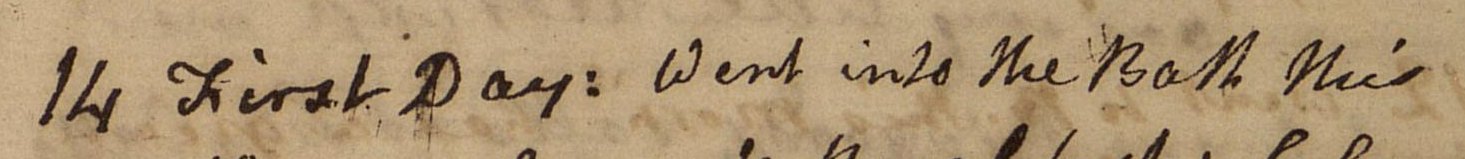14 First Day: went into the Bath this
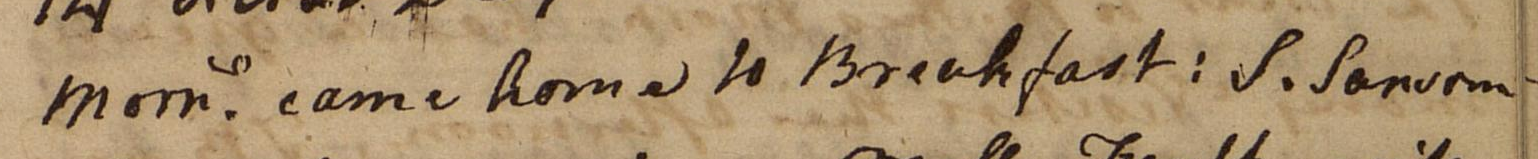Morn^g. came home to Breakfast: S. Sansom
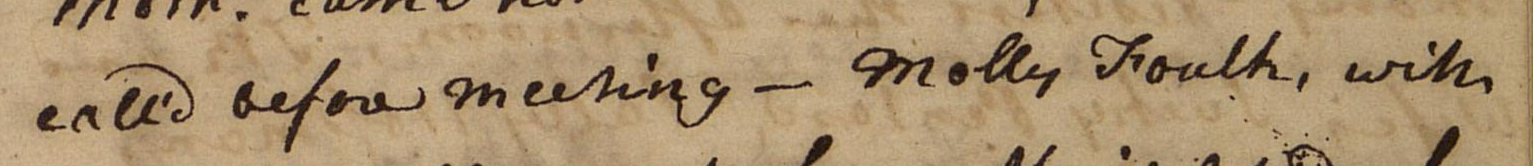call'd before meeting- Molly Foulk, with
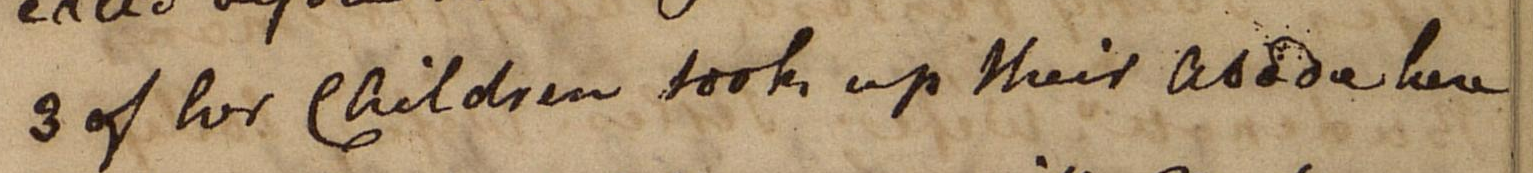3 of her Children took up their abode here
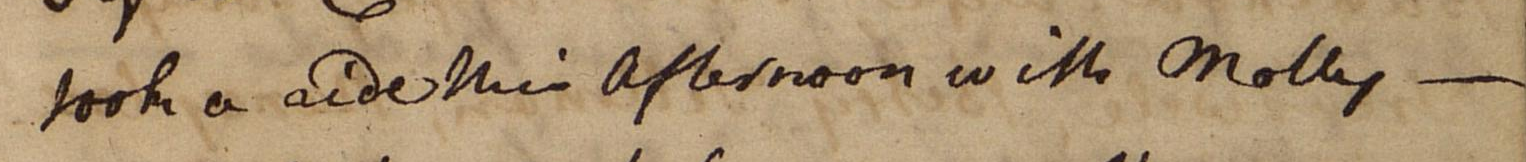took a aide this afternoon with Molly-
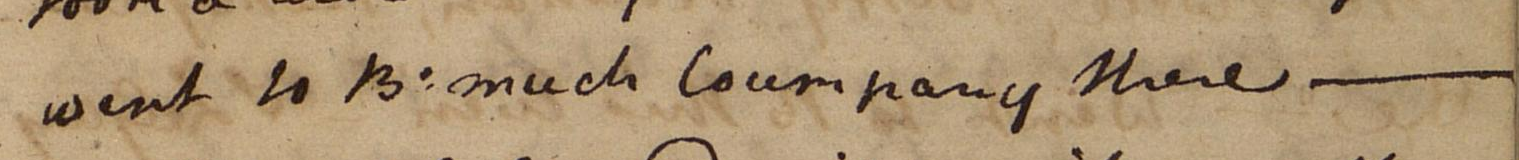went to B. much Coumpany there-
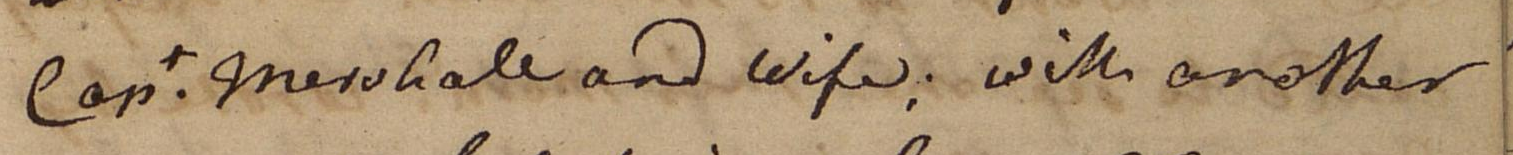Cap^t. Mershall and wife; with another
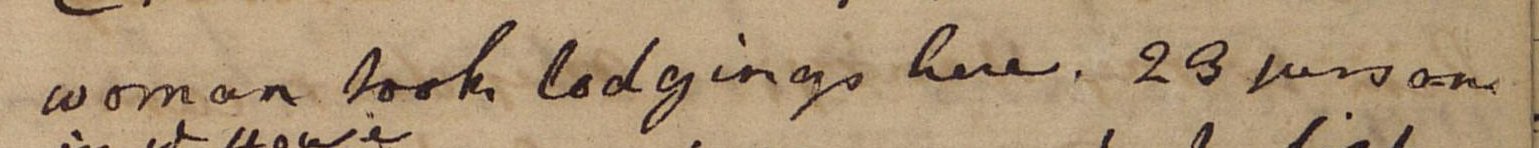woman took lodgings here, 23 person
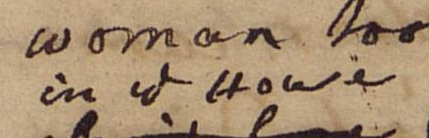in y^e House
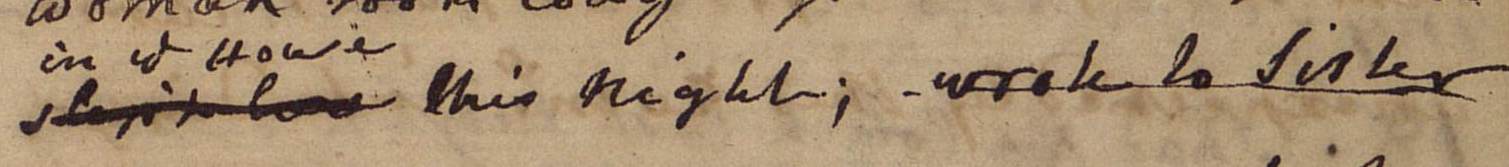[slep't here] this night; - [wrote to sister]
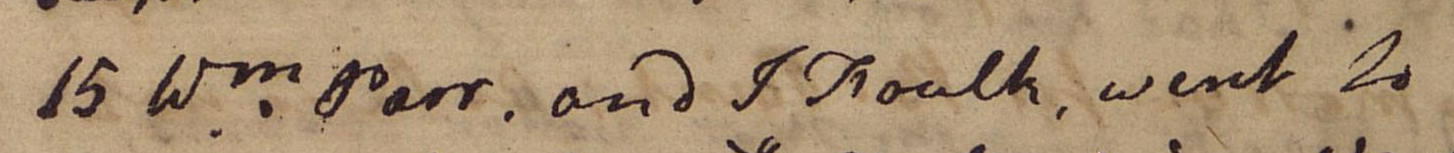15 W^m. Parr, and T Foulk, went to
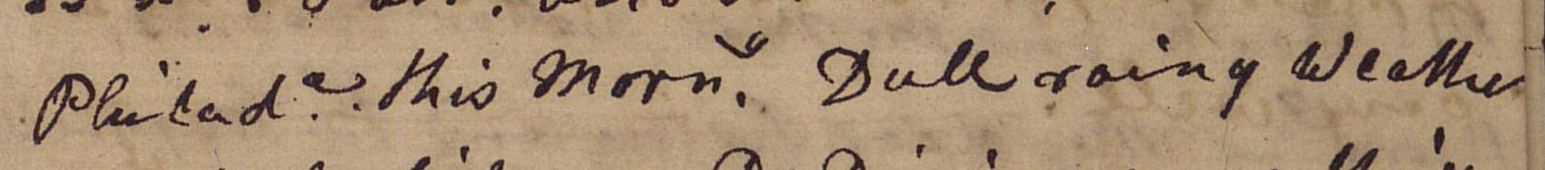Philad^a. this Morn^g. Dull rainy Weather
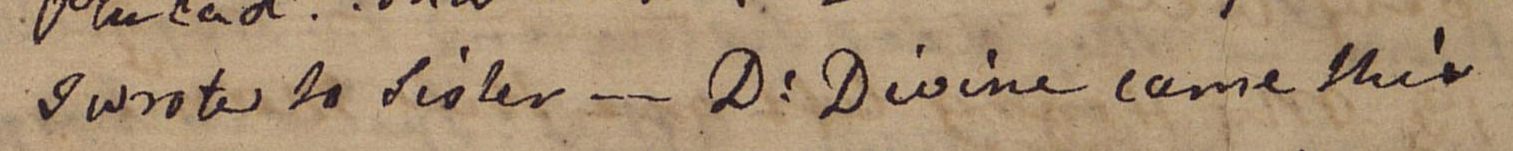I wrote to Sister- D: Divine came this
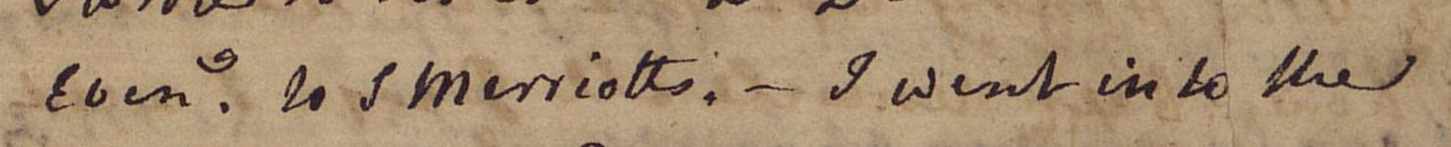Even^g. to S Merriotts.- I went in to the
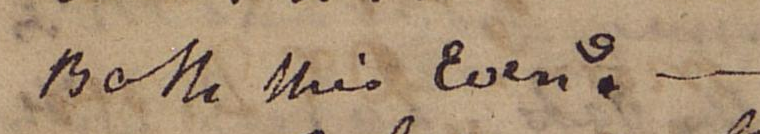Bath this Even^g.-
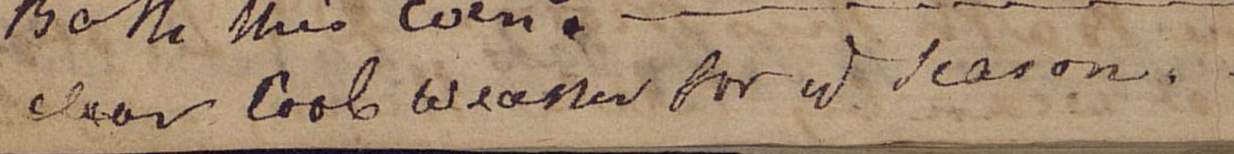clear Cool Weather for y^e season. -
